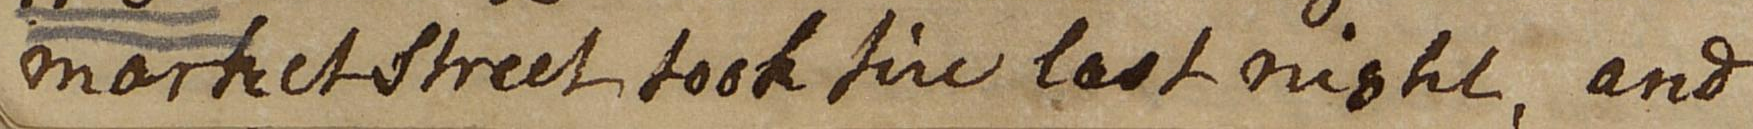Market Street took fire last night, and
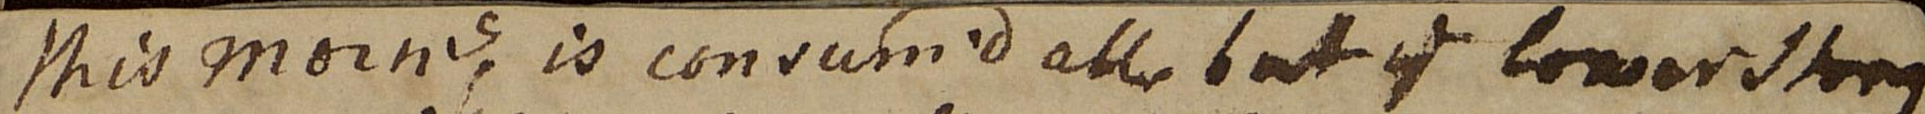this morn^g. is consum'd all but y^e lower Storg
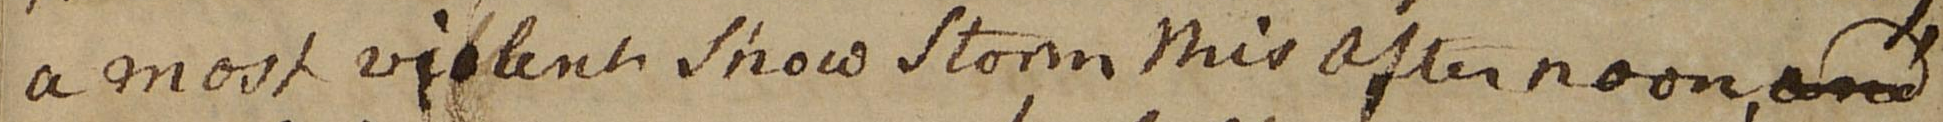a most violent snow Storm this after noon, and
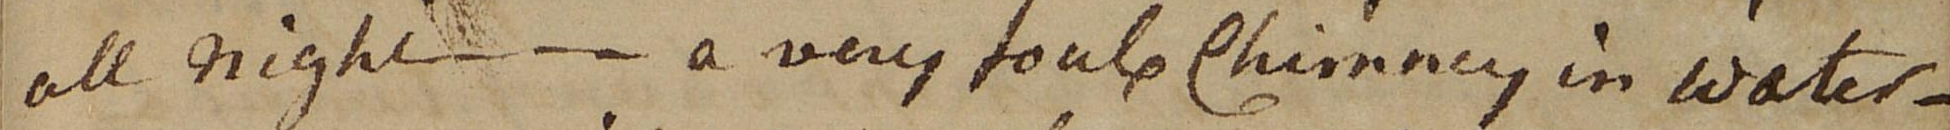all night-- a very foul Chimney in Water-
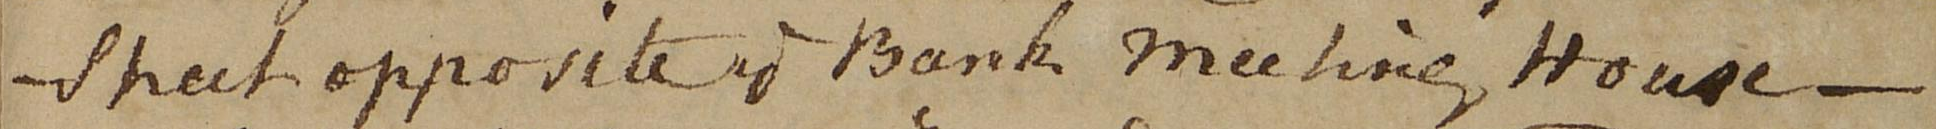Street opposite y^e Bank Meeting House-
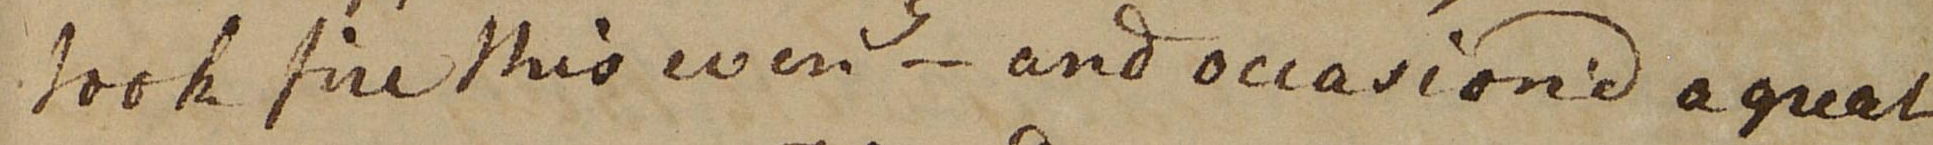took fire this even^g- and occasion'd a great
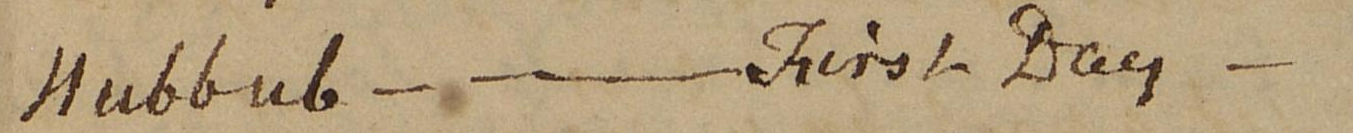Hubbub-- First Day-
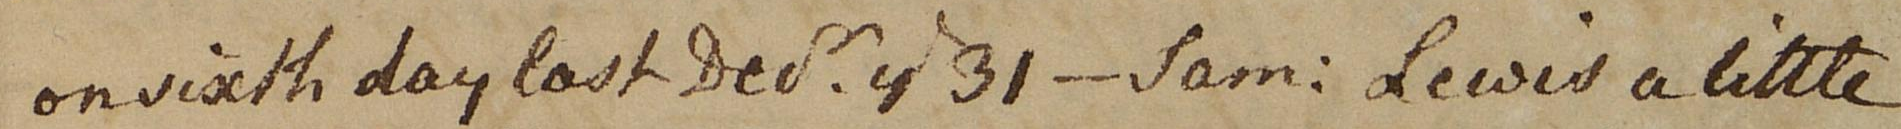on sixth day last Dec^r. y^e 31- Sam: Lewis a little
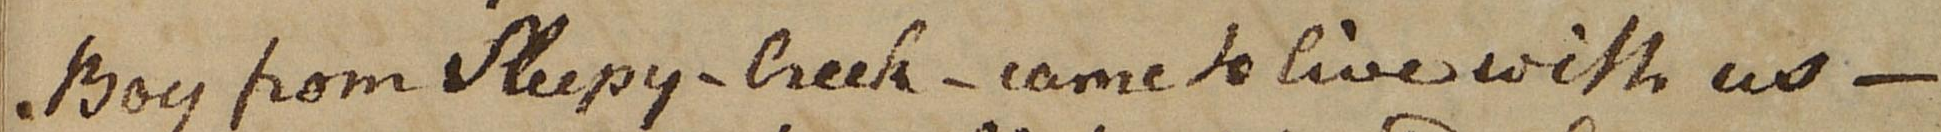Boy from Sleepy- Creek- came to live with us-
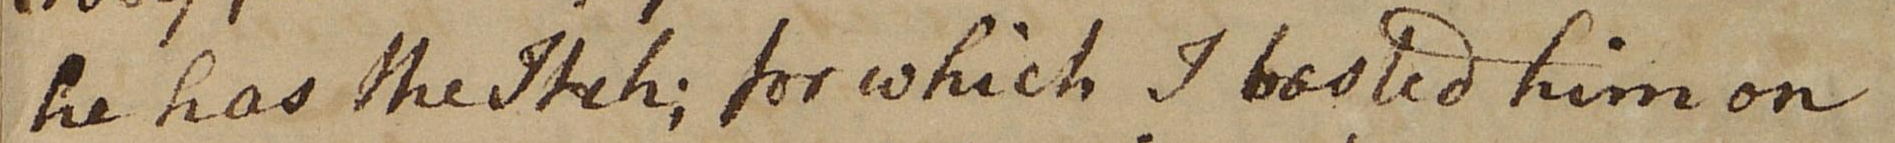he has the Itch; for which I bosted him on
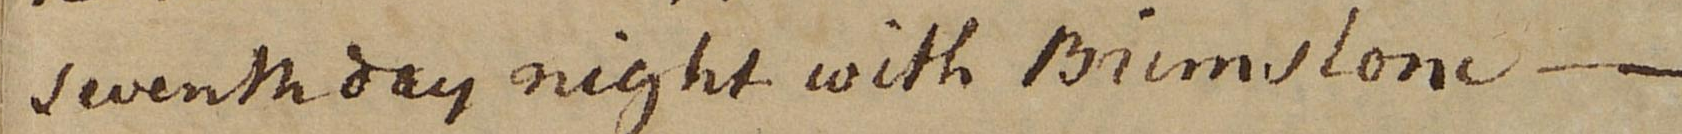seventh day night with Brimstone-
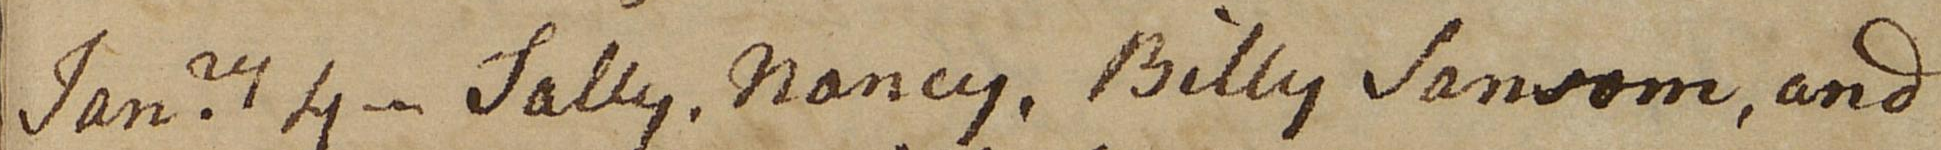J an^ry. 4- Sally, Nancy, Billy Sansom, and
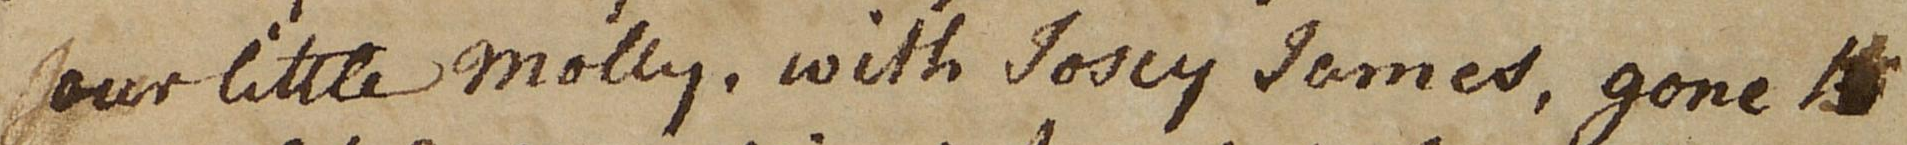our little Molly. with Josey James, gone to
